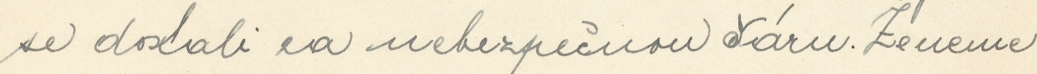se dostali za nebezpečnou čáru. Ženeme
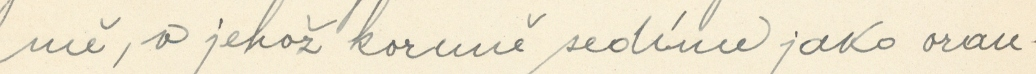mě, v jehož koruně sedíme jako oran-
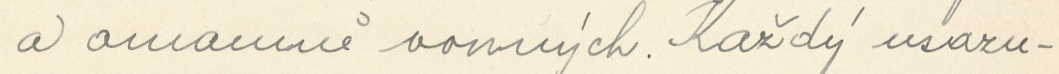a omamně vonných. Každý usazu-
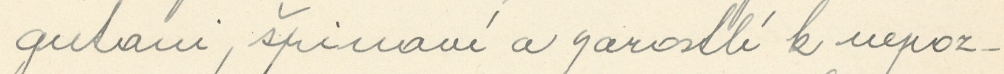gutani, špinaví a zarostlí k nepoz-
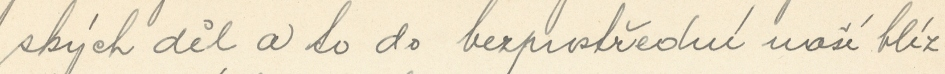ských děl a to do bezprostřední naší blíz-
